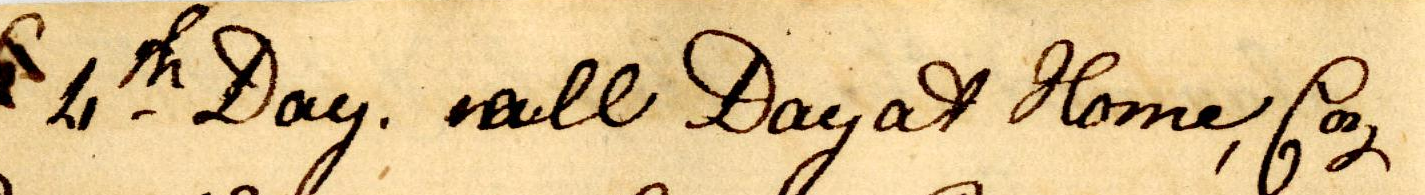4^th Day. all Day at Home, Coz
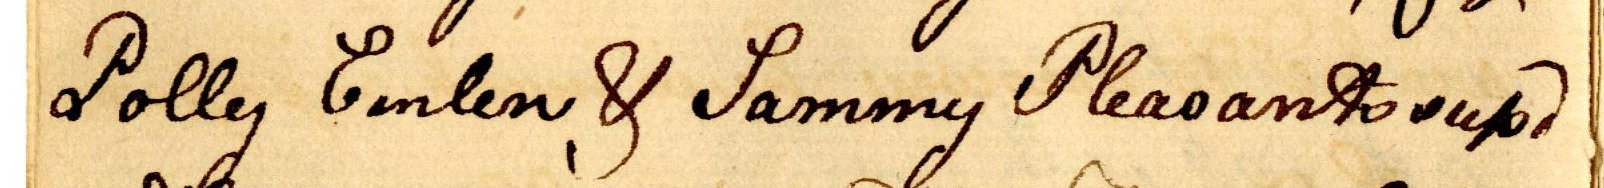Polly Emlen & Sammy Pleasants supd
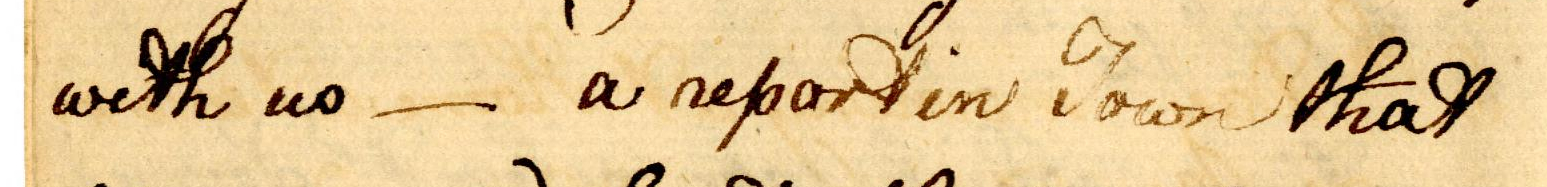with us - a report in Town that
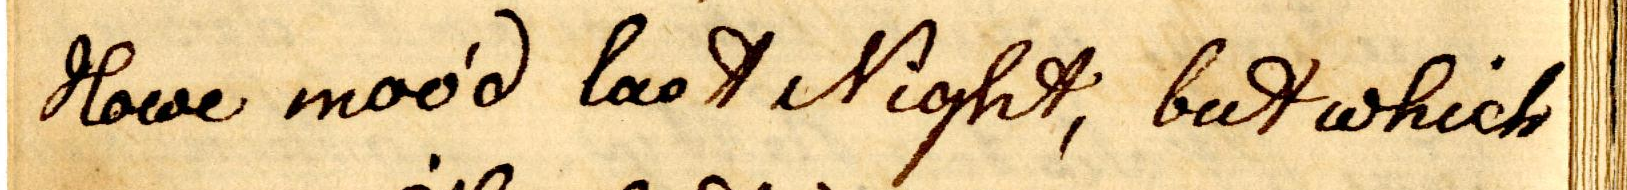Howe mov'd last Night, but which
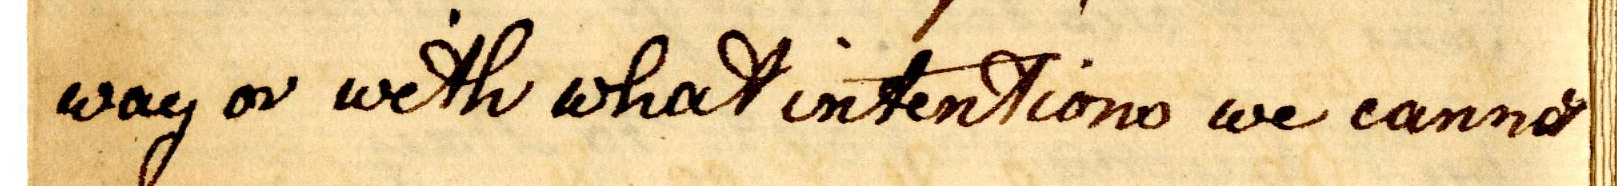way or with what intentions we cannot
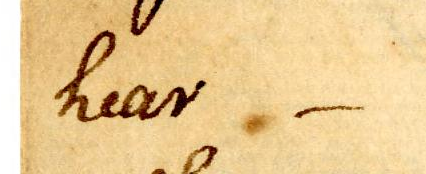hear-
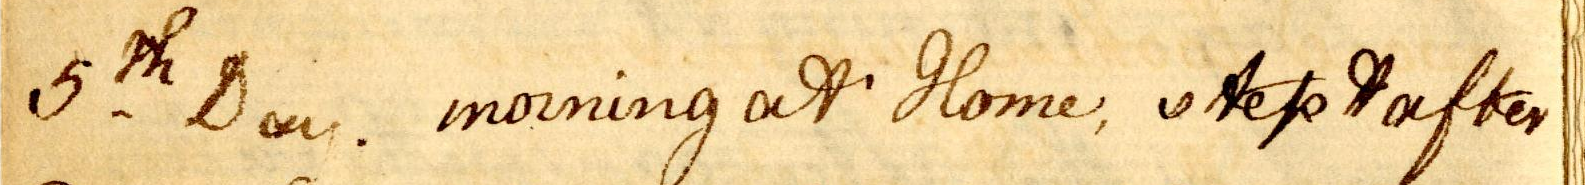5^th Day. morning at Home, stept after
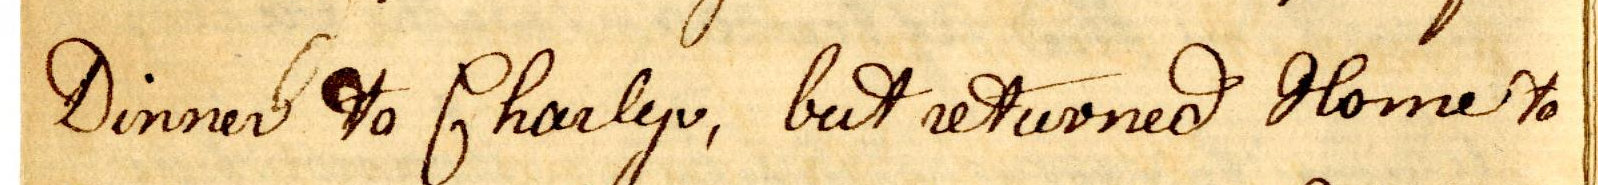Dinner to Charlys, but returned Home to
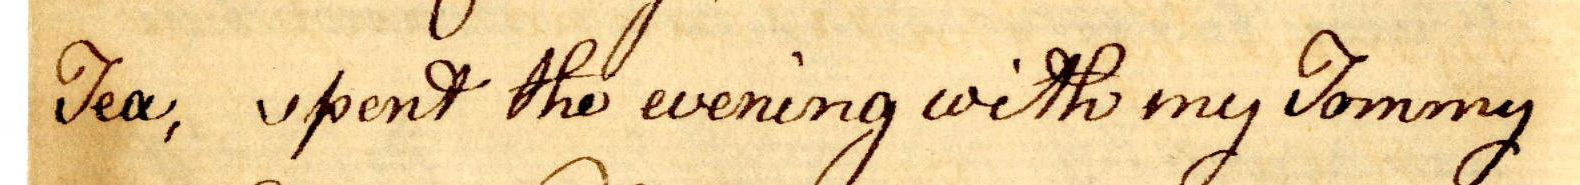Tea, spent the evening with my Tommy
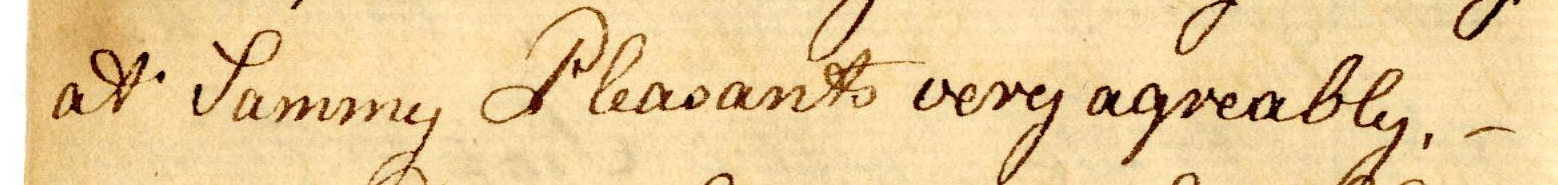at Sammy Pleasants very agreably.-
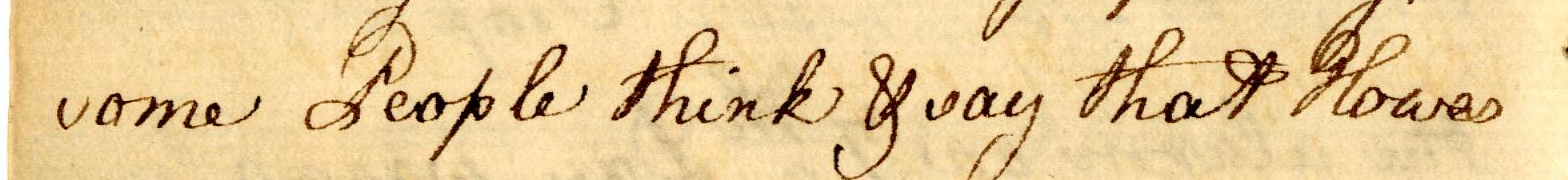some People think & say that Howes
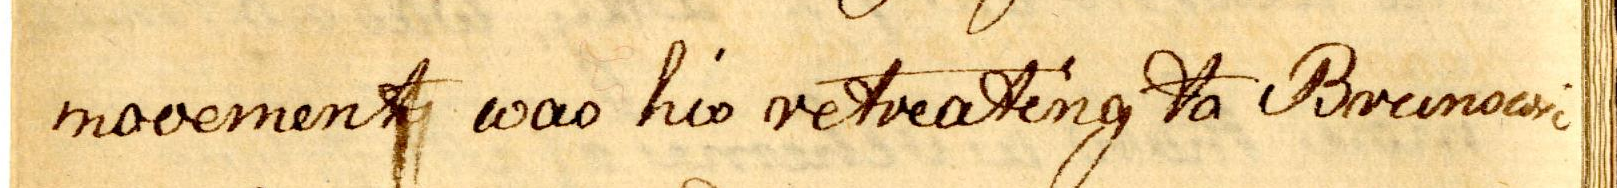movement was his retreating to Brunswic
